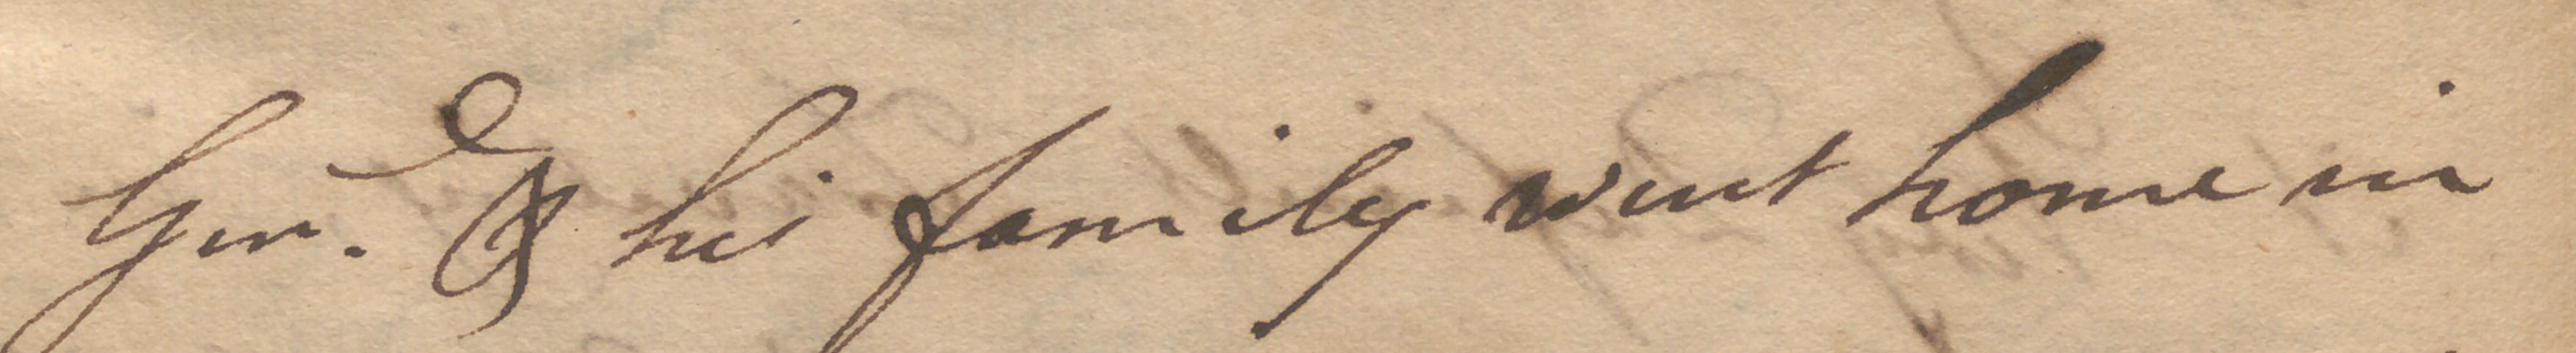Gen^l. & his family went home in
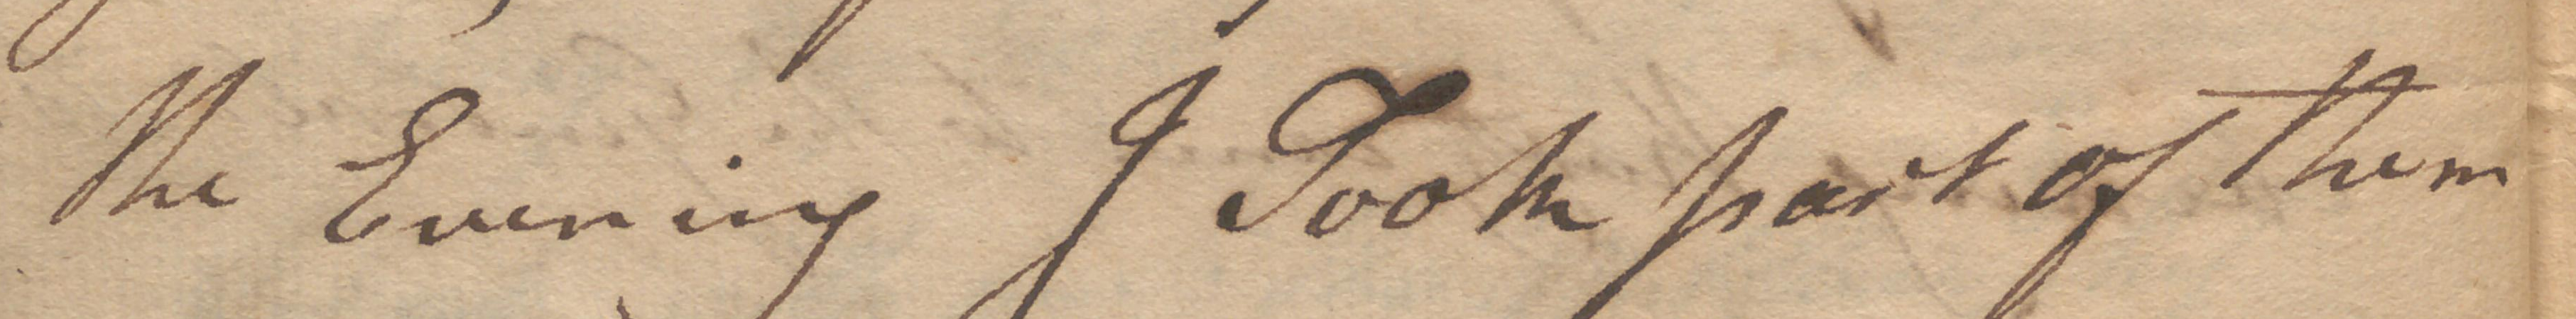The Evening I Took part of them
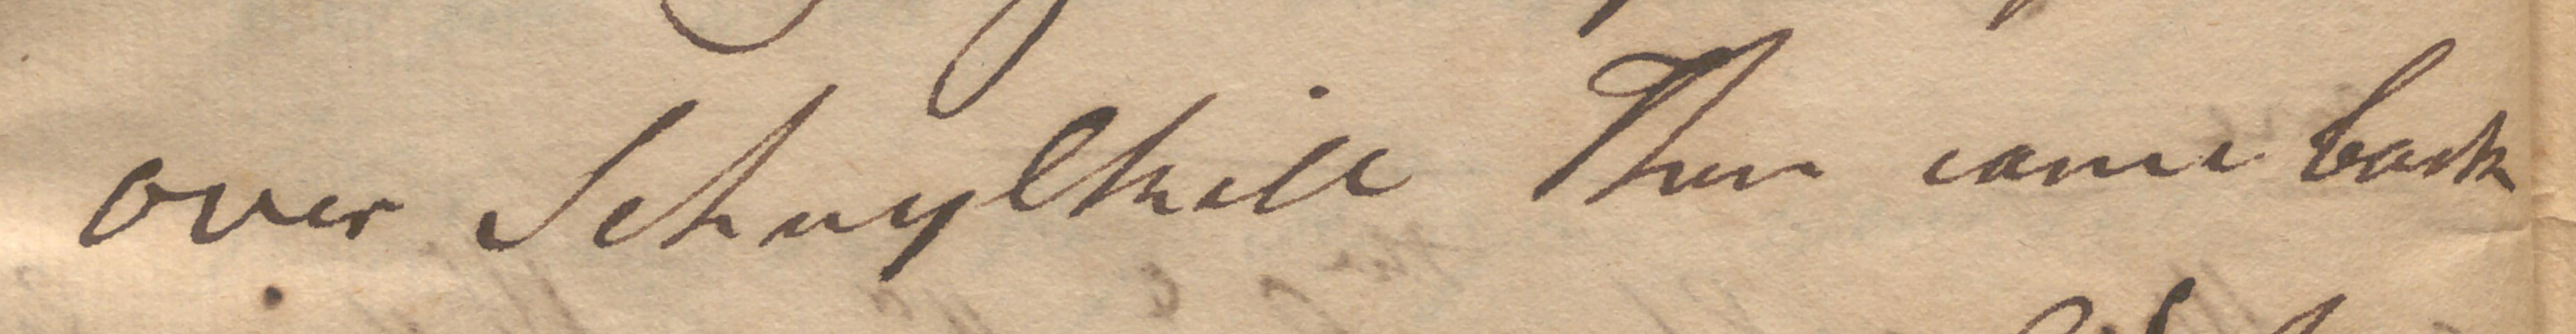over Schuylkill Then came back
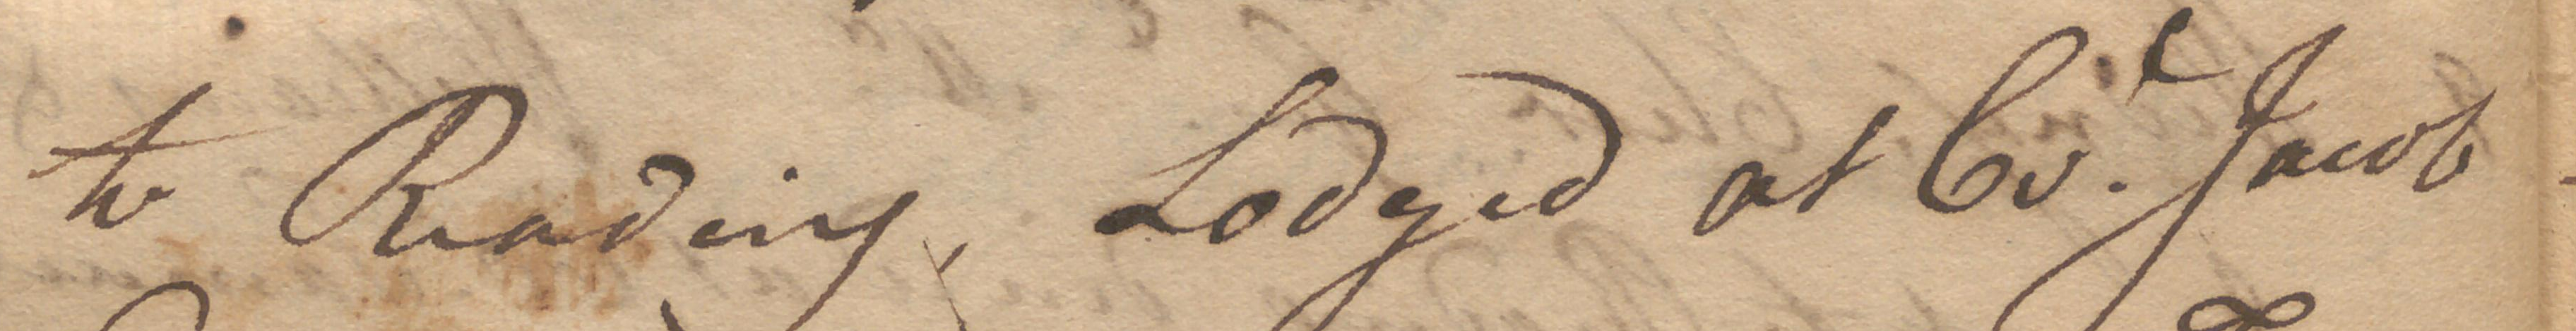to Reading Lodged at Co^l. Jacob
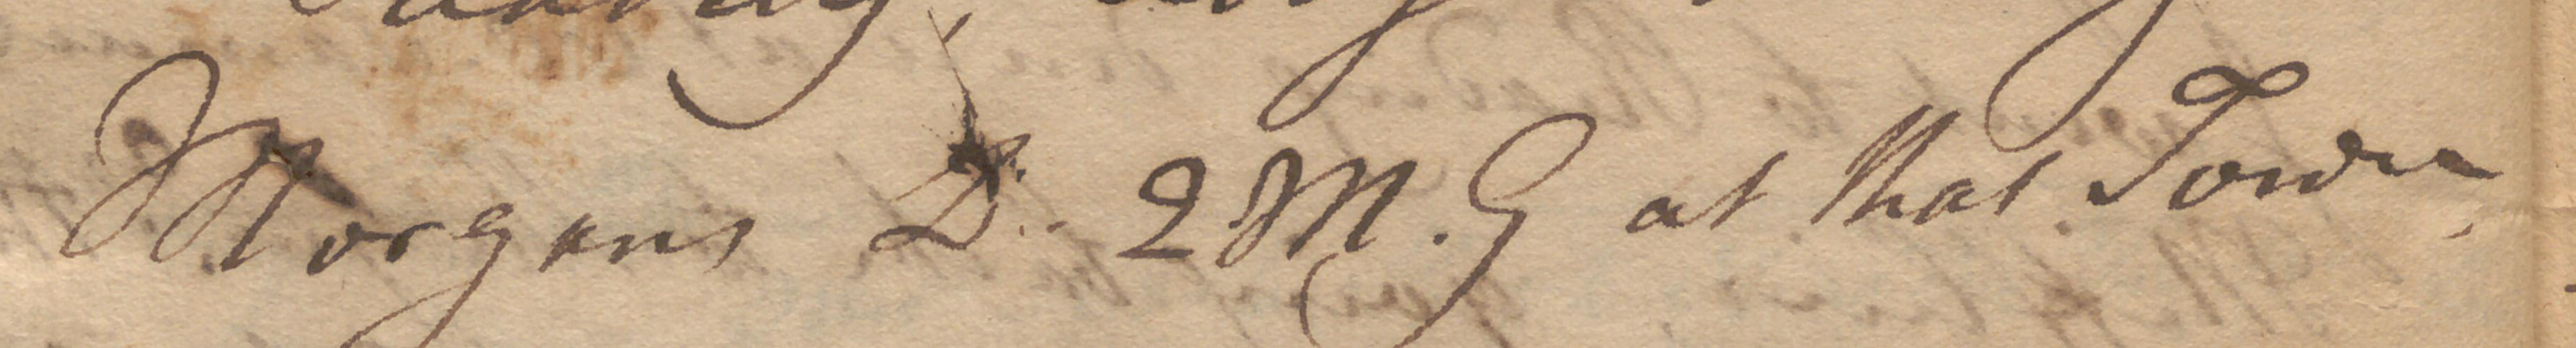Morgans D. QMG at that Town
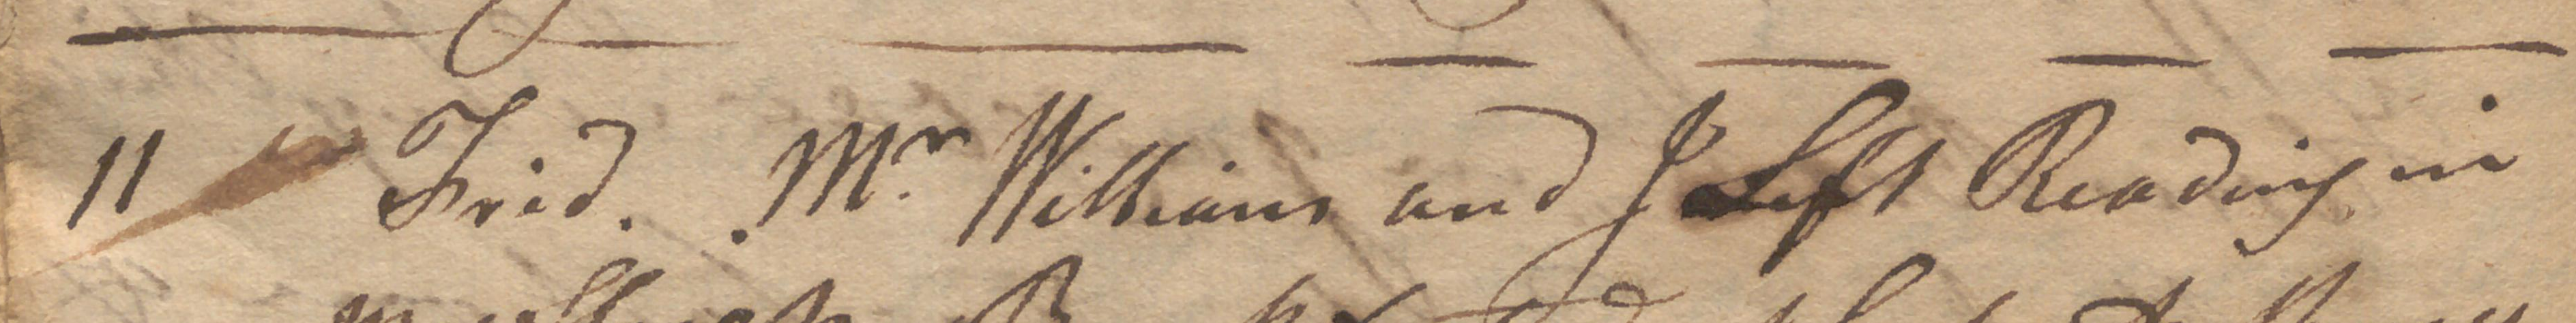11 Frid. M^r. Williams and I Left Reading in
